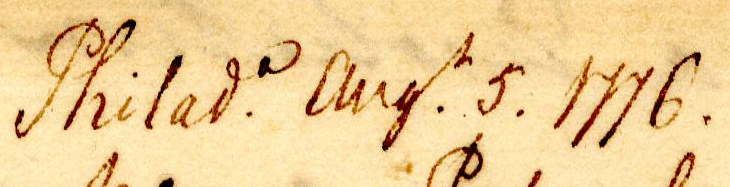Philad^a. Aug^t. 5. 1776.
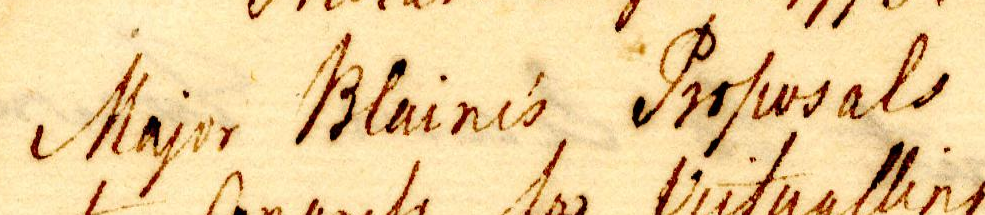Major Blaine's Proposals
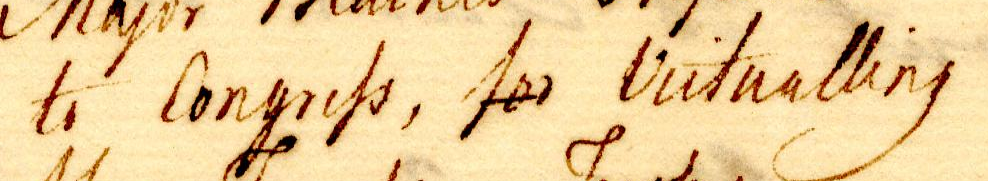to Congress, for Victualling
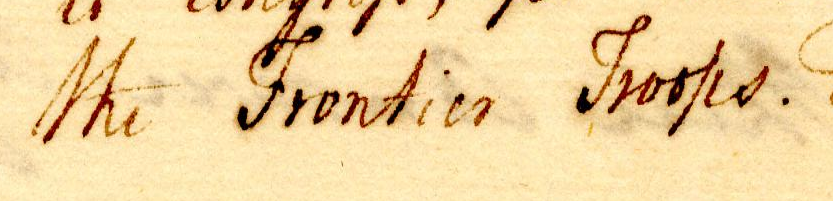the Frontier Troops.
